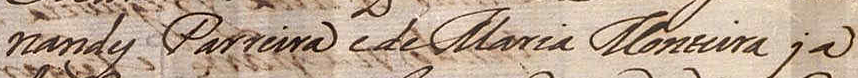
nandes Parreira e de Maria Monteira ja
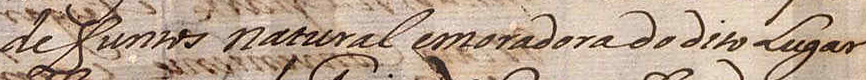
defuntos natural e moradora do dito Lugar
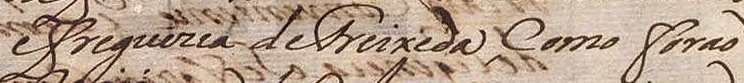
e freguezia de Freixeda, Como foraõ
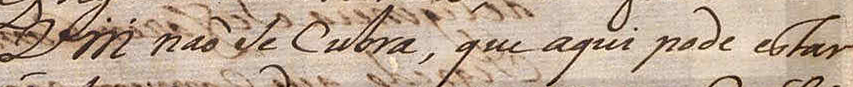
V M naõ se Cubra, que aqui pode estar
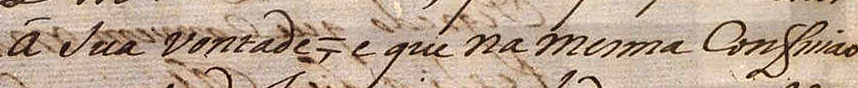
á sua vontade = e que na mesma Confissaõ
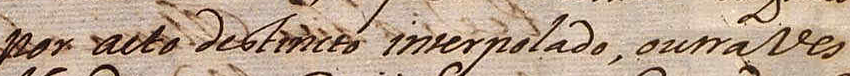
por acto destincto interpolado, outra ves
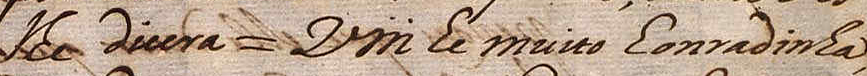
lha dicera = VM he muito honradinha,
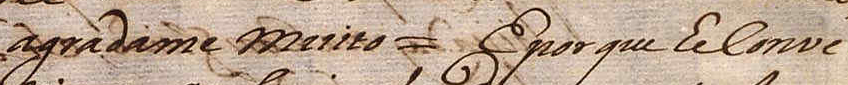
agradame muito = E porque he Conve
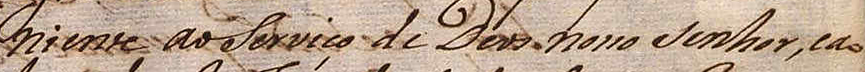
niente ao Serviço de Deos nosso senhor, e a
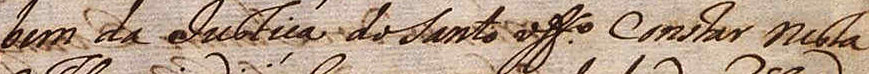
bem da Iustiça do santo off.o Constar nesta
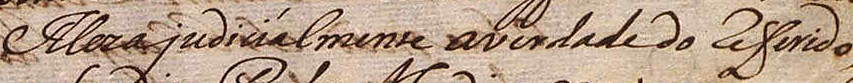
Meza judicialmente a verdade do Referido,
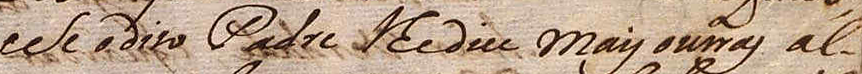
e Se o dito Padre lhe dice mais outras al
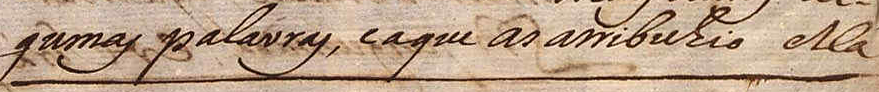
gumas palavras, e a que as atribuhio ella
